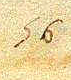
56
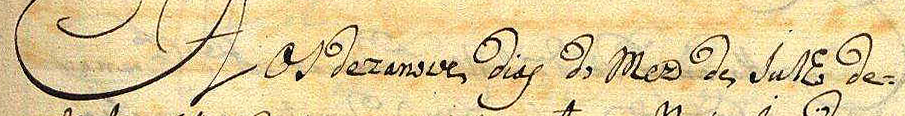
Aos dezanove dias do Mez de Iulho de
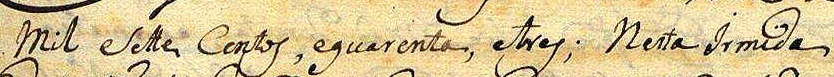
mil SetteCentos, e quarenta, e tres; Nesta Irmida
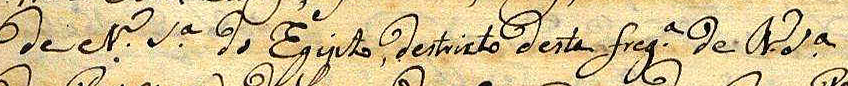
de N. S.a do Egipto, destricto desta freg.a de N. s.a
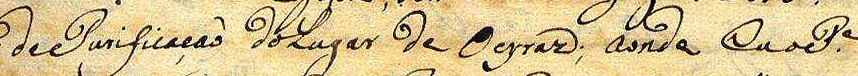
de Purificaçaõ do Lugar de Oeyraz; aonde Eu o P.e
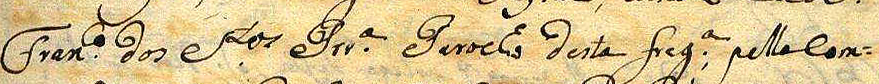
Fran.co dos S.tos Prr.a Parocho desta freg.a; pella com
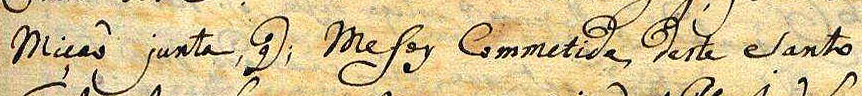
miçaõ junta, q̄; me foy Commetida deste Santo
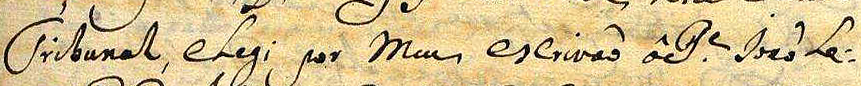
Tribunal, eLegi por meu escrivaõ o P.e Ioaõ Le
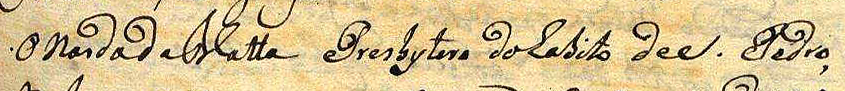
onardo da Matta Presbytero do habito de s. Pedro,
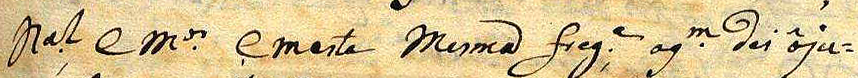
N.al, e m.or em esta mesma freg;a a q.m dei o ju
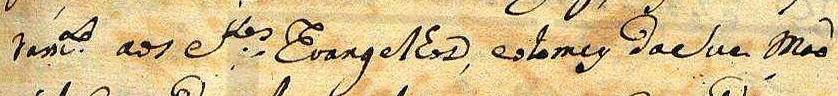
ram.to aos S.tos Evangelhos, e o tomey da Sua maõ
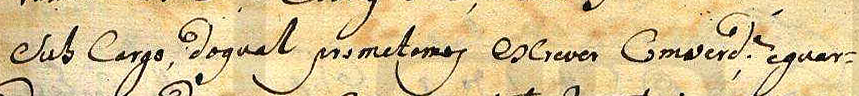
Sub Cargo, do qual prometemos escrever Com verd.e, e guar
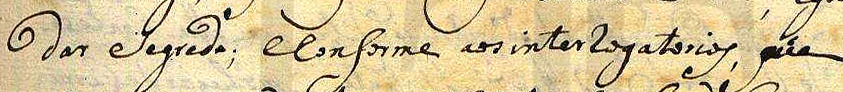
dar Segredo; e conforme aos interRogatorios, que
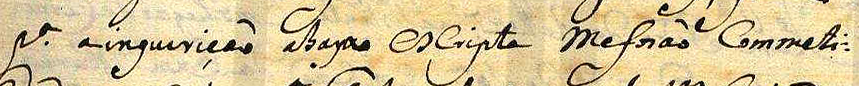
p.a a inqueriçaõ abayxo escripta me foraõ Commeti
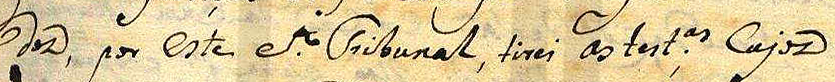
doz, por este s.to Tribunal, tirei as test.as, Cujoz
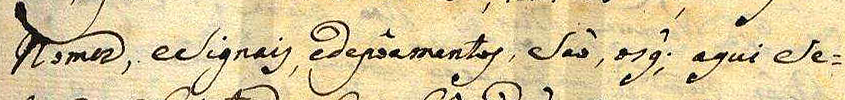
Nomez, e Signais, e depoementos, Saõ, os q̄, aqui se
